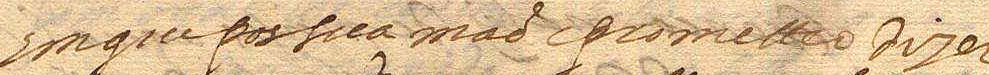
Em que pos sua maõ e prometteo dizer
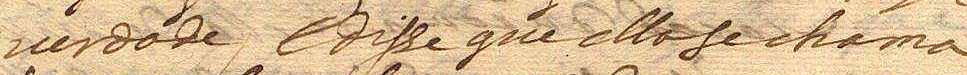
uerdade, E disse que ella se chama
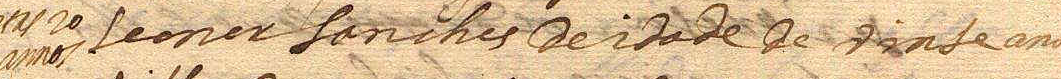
Leonor sanches de idade de vinte anos
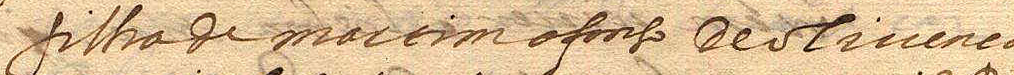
filha de martim afonso de oliuença
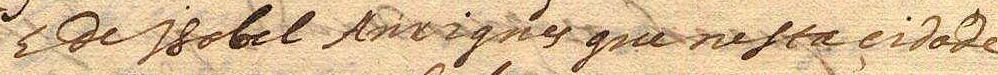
E de jsabel Anriques que nesta çidade
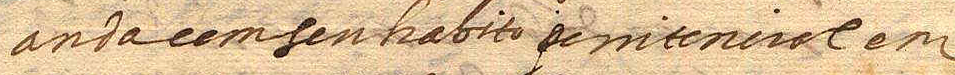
anda com seu habito penitencial em
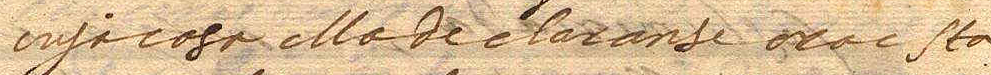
cuja casa ella declarante ora esta
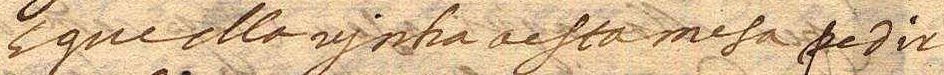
E que ella ujnha a esta mesa pedir
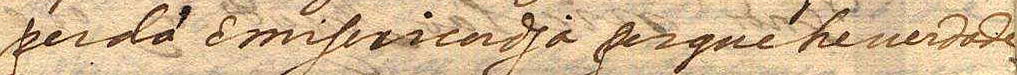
perdā E misericordja porque he uerdade
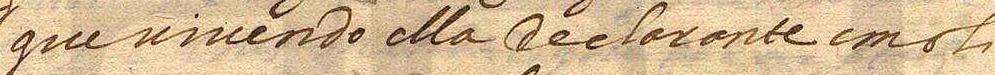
que uiuendo ella declarante em oli
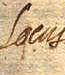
Locus
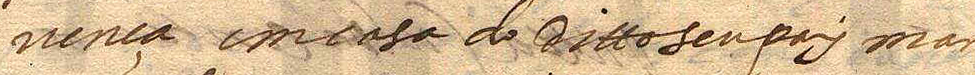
uença em casa do ditto seu pay mar
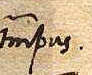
t̄mpus
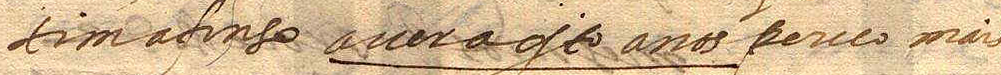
tim afonso auera ojto anos pouco mais
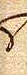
8
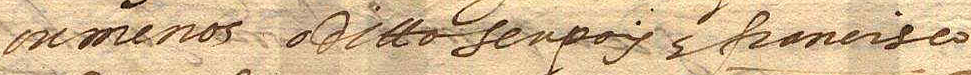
ou menos o ditto seu pay E francisco
